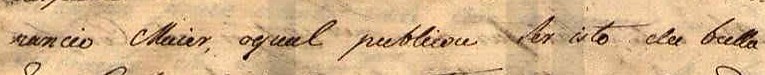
nancio Maier, o qual publicou ser isto da bulla
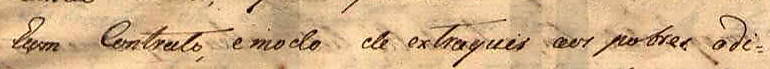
hum Contrato, e modo de extruquir aos pobres o di
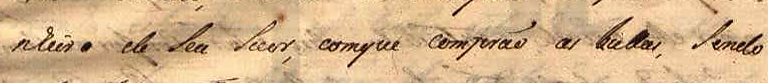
nheiro de seu suor, com que compraõ as bullas, sendo
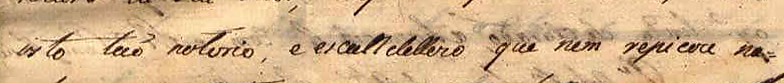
isto taõ notorio, e escaNdellezo que nem repicou na
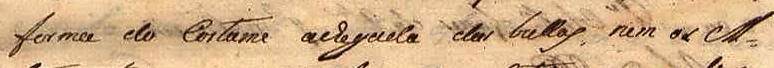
forma do Costume a chegada das bullas, nem os Al
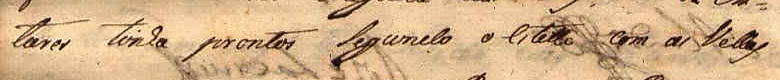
tares tinha prontos segundo o litello com as Vellas
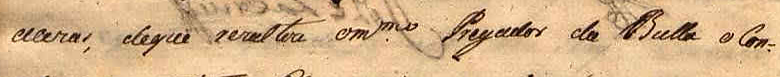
acezas, de que rezultou o m.mo Pregador da Bulla o Con
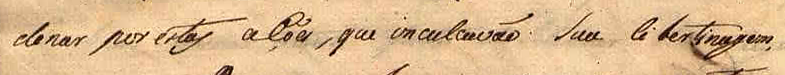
denar por estas aÇoẽs, que inculcavaõ sua libertinagem,
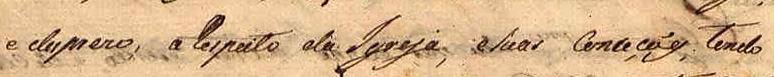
e desprezo, a Respeito da Igreja, e suas conceçoẽs, tendo
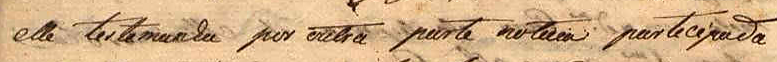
elle testemunha por outra parte noticia partecipada
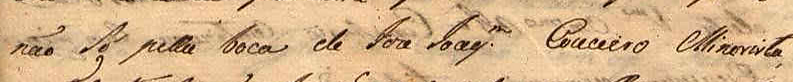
não só pella boca de Ioze Ioaq.m Couceiro Minorista,
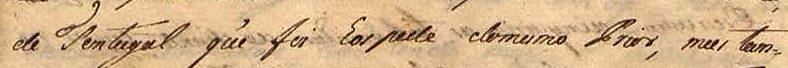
de Tentugal que foi hospede do mesmo Prior, mas tam
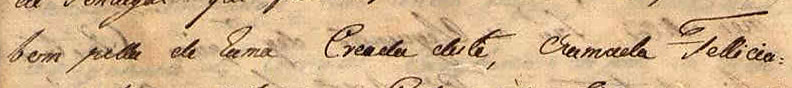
bem pelo de huma Creada deste, chamada Fellicia
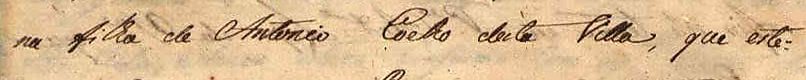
na filha de Antonio Coelho desta Villa, que este
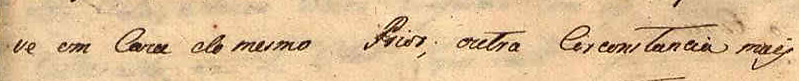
ve em Caza do mesmo Prior, outra Circonstancia mais
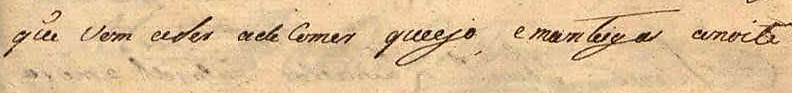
que vem a ser a e de comer queejo, e manteiga a noite
